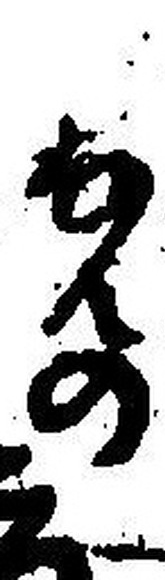じんの
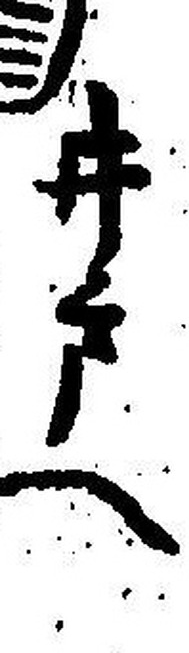井戸へ
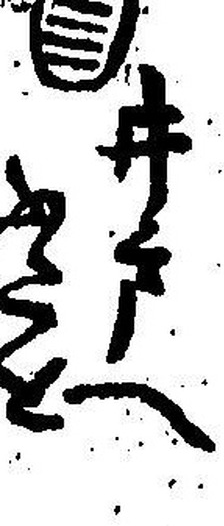ふたを
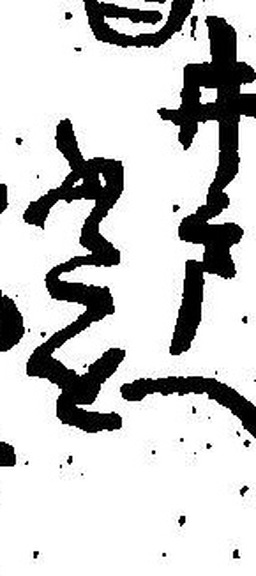ふたを
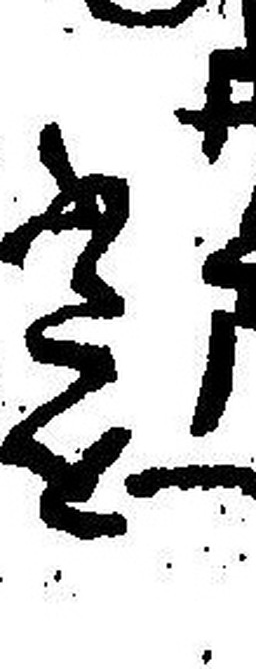ふたを
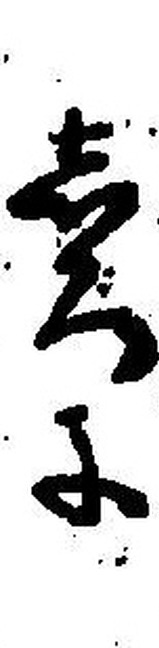しろよ

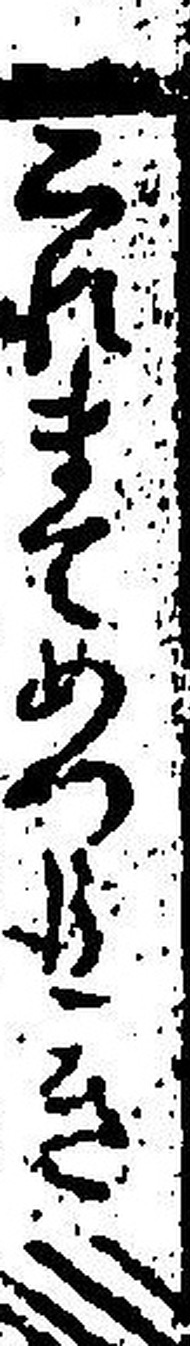これまてめつらしき
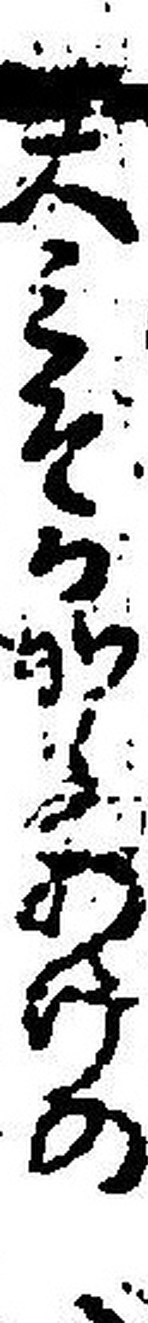大みそかからあけの
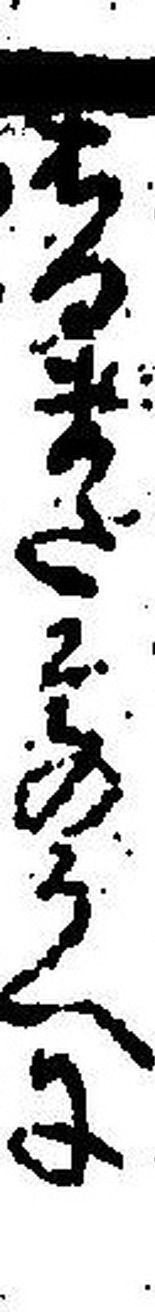はるまだそのうへに
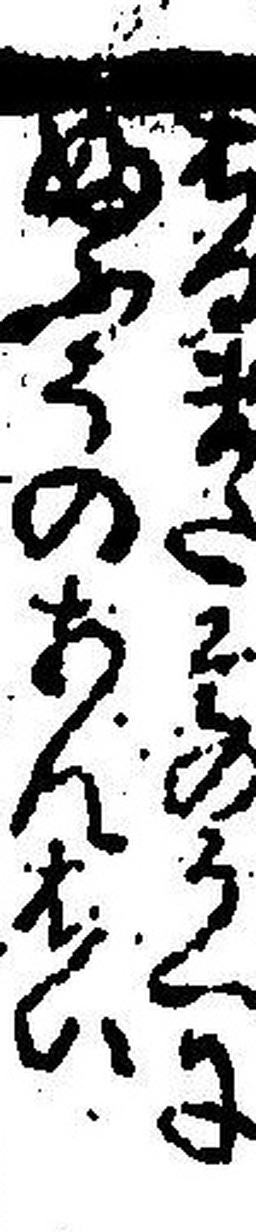ふふうのあんはい
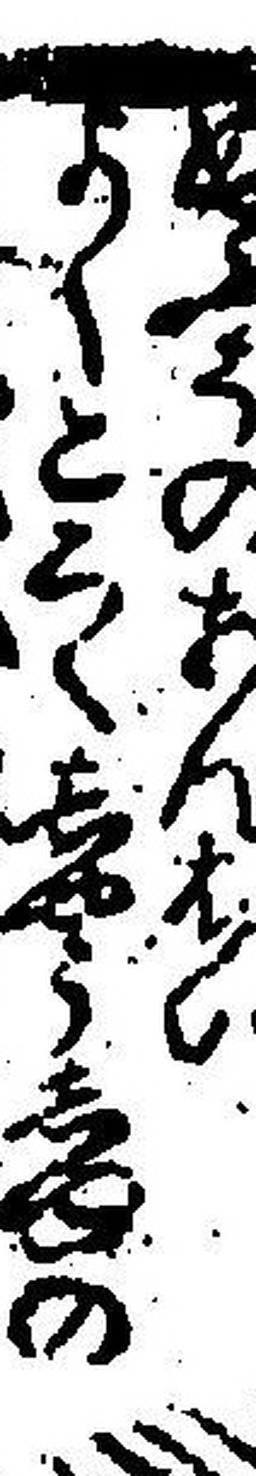よくここくしやうしゆの
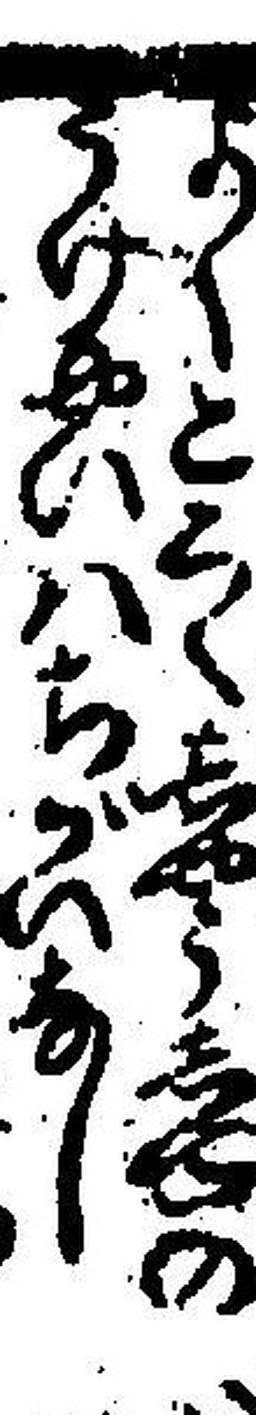うけやいはちがいなし
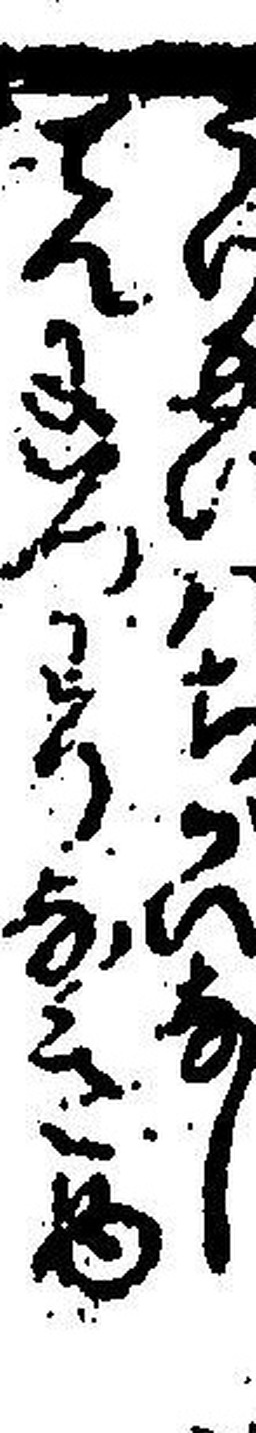てんにいつわりなき物
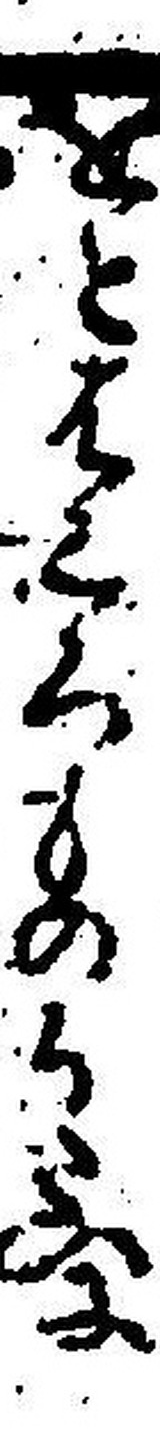をとはころものうたいに
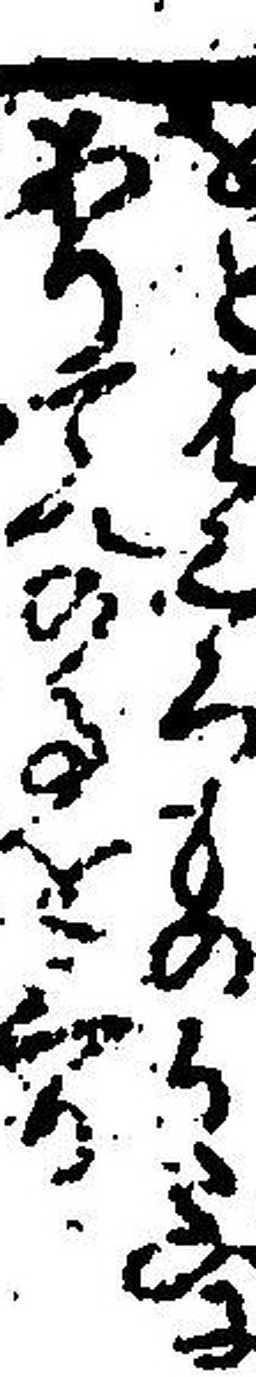ありてんの事を三？り
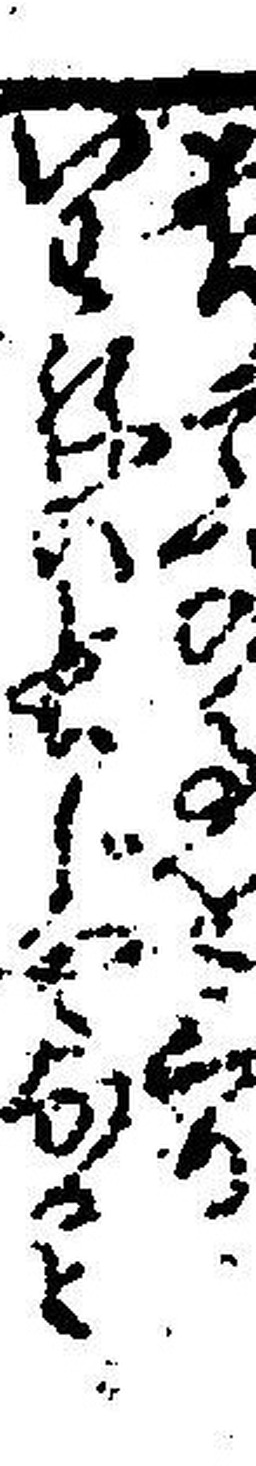いわねは長じやな？ると
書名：天竺儲之筋 / 市場通笑作
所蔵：東京大学総合図書館 General Library in the University of Tokyo, JAPAN
